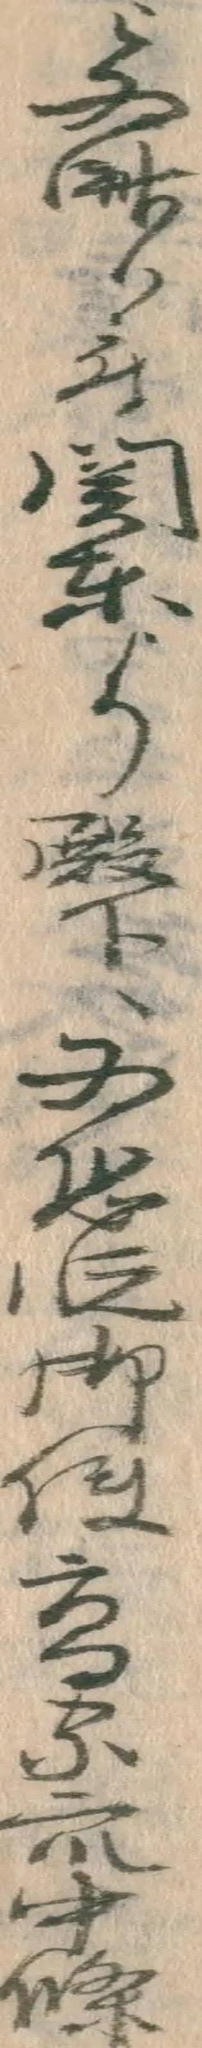被為済候ニ付関東より殿下へ為恐悦御使高家衆中條
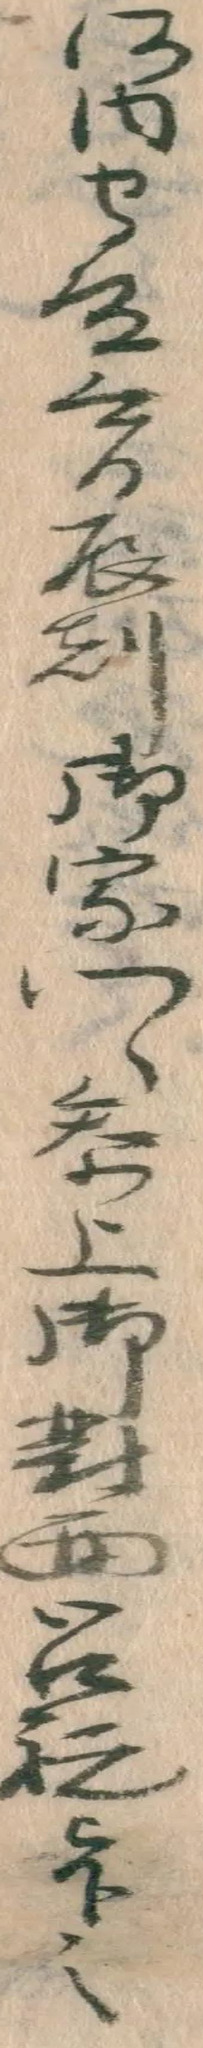河内守殿今日辰刻御家門へ参上御對面御口祝被下也
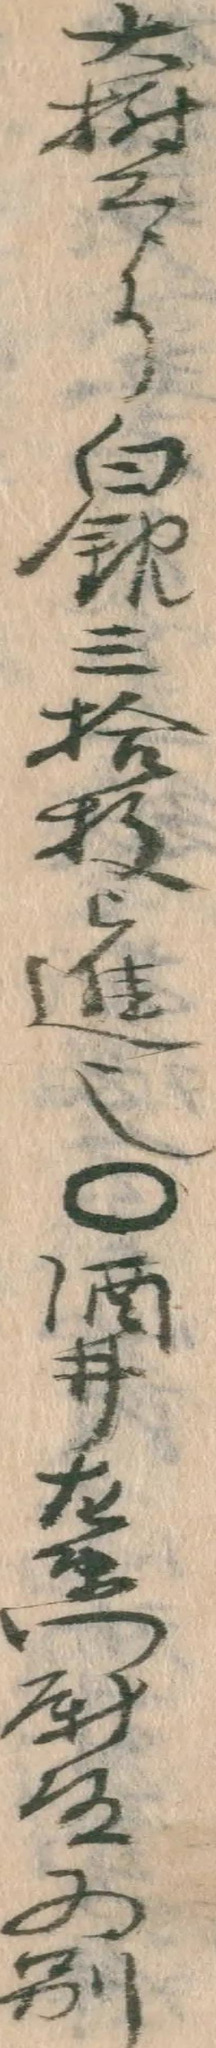大樹公より白銀三拾枚被進也○酒井左衛門尉殿為別
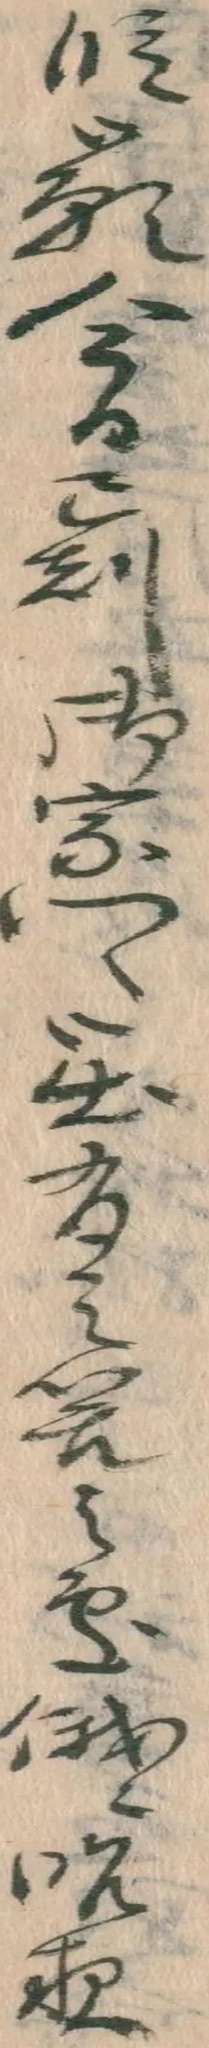段御願今日巳刻御家門へ御出有之筈之處俄二昨夜
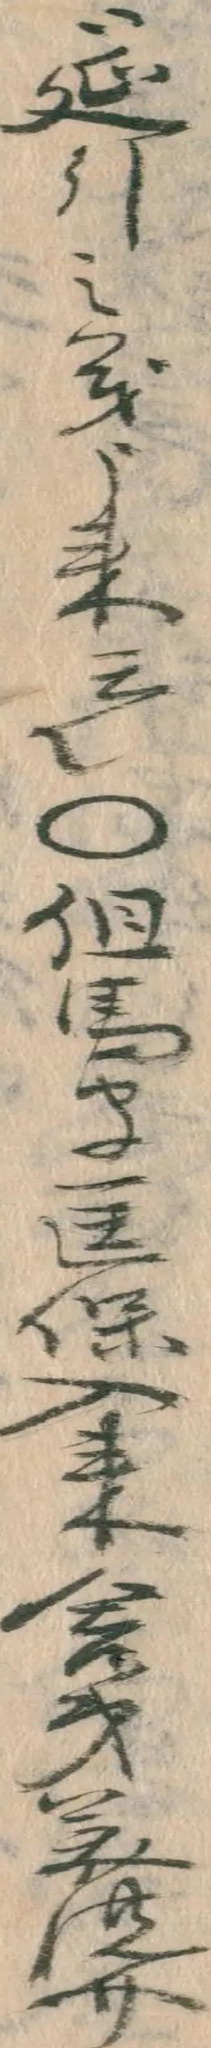御延引之義申来云々○但馬守匡保入来舎弟美濃介
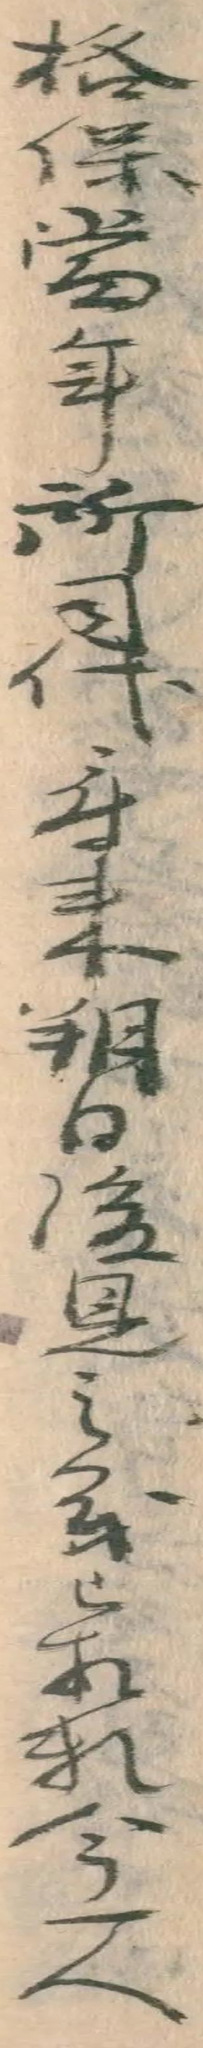格保當年所司代ニ付来朔日後見之義被相頼今一人
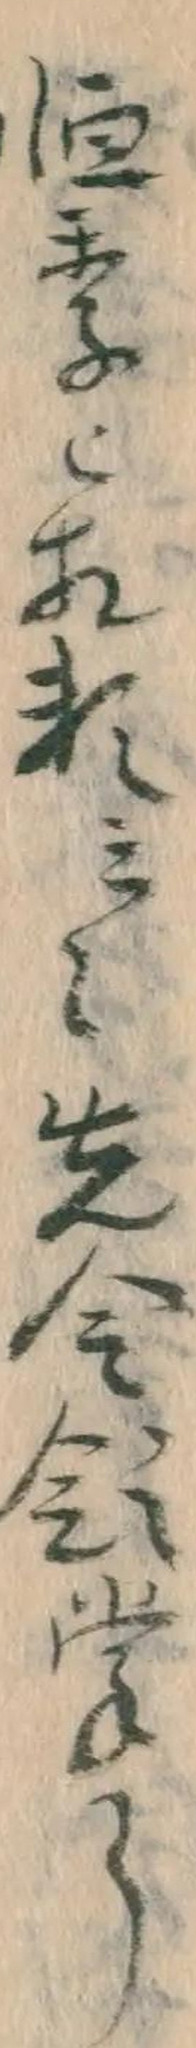恒季被相頼云々先令領掌了
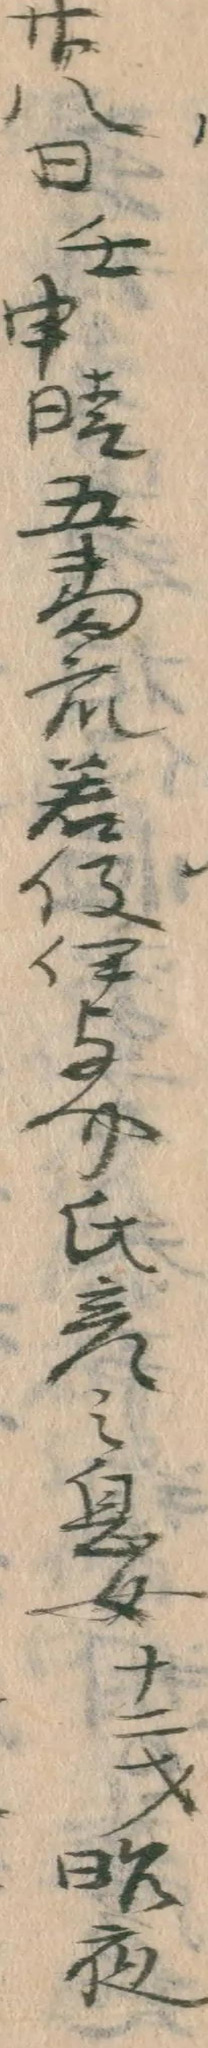廿八日壬申晴五番衆若役伊与介氏彦之息女十二才昨夜
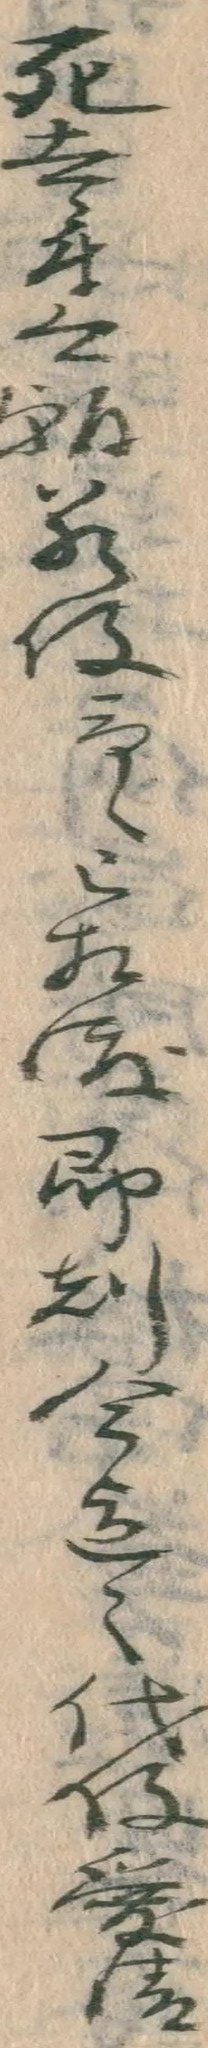死去ニ付今朝若役予へ被相渡即刻今迄之代役愛清
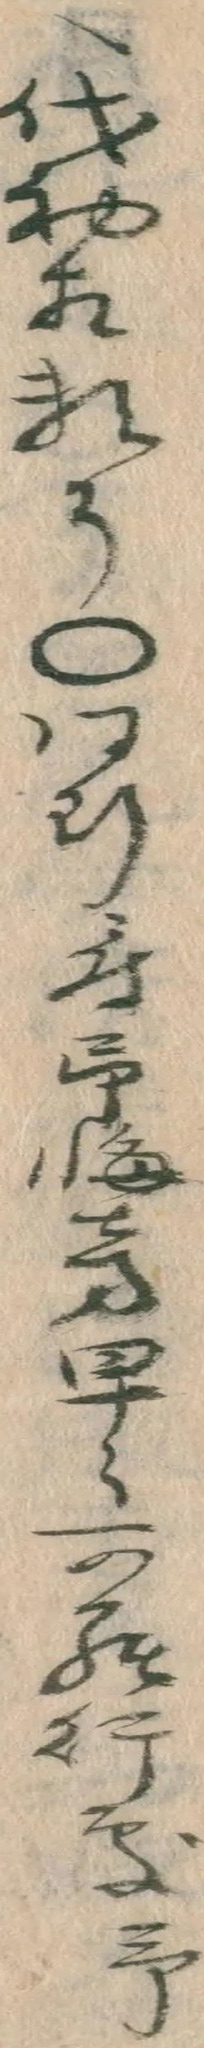へ代勤相頼了○同断ニ付予悔旁早々可罷行處予
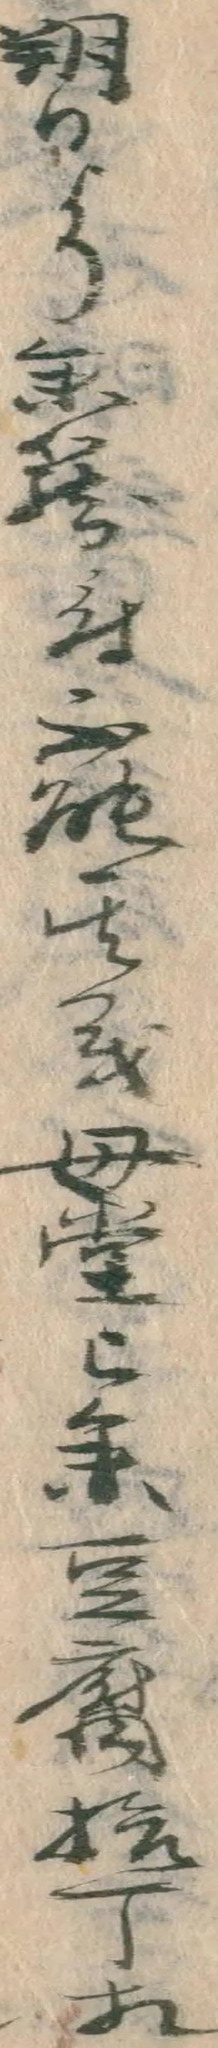朔日より参籠ニ付不能其義母堂被参豆腐拾丁相
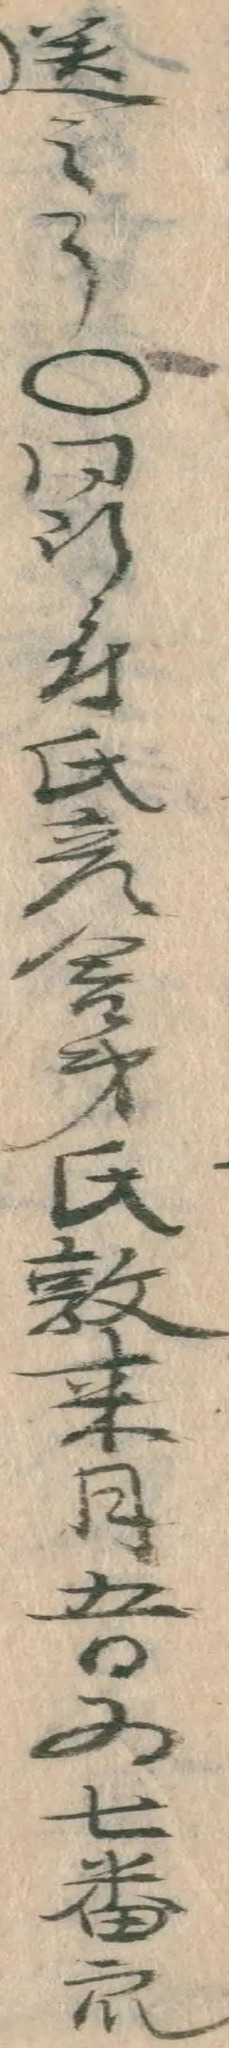送之了○同断ニ付氏彦舎弟氏敦来月五日為七番衆
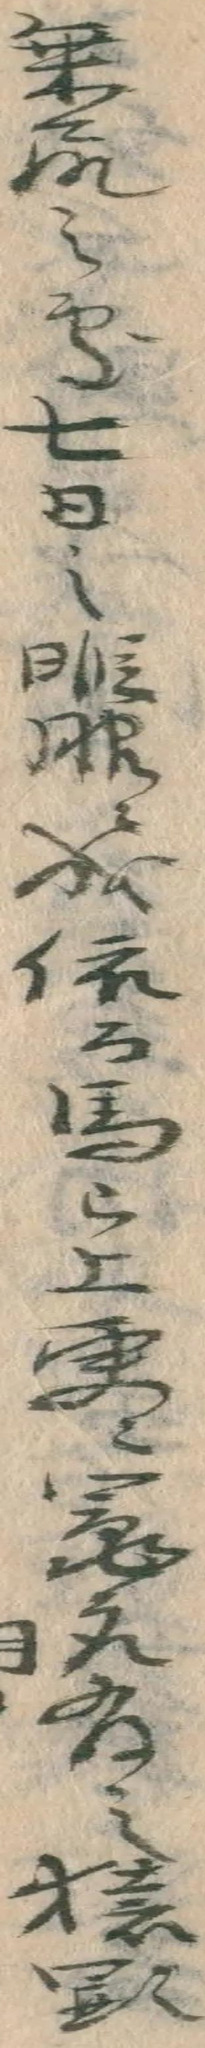乗尻之處七日之暇服ニ成依而馬被上更二鬮取有之猿顕
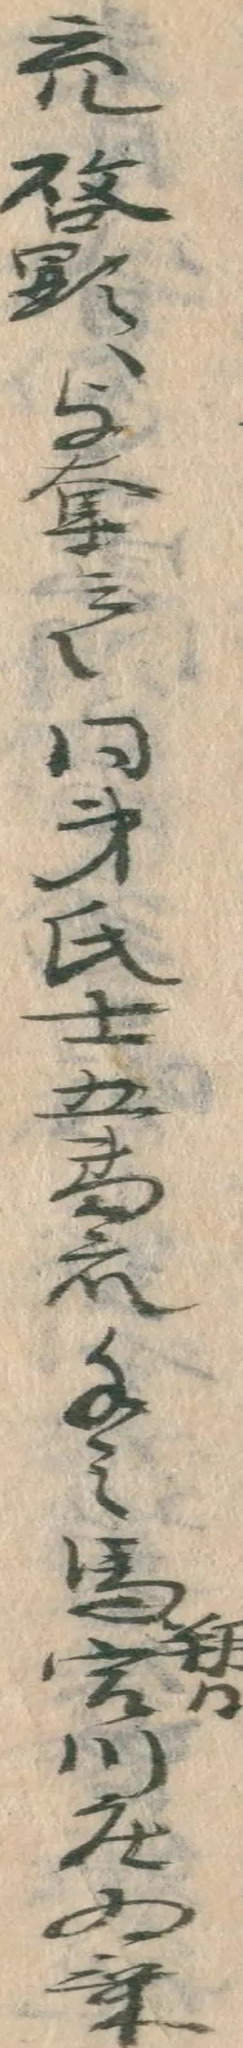充啓顕へ与奪云〻同弟氏士五番衆手之馬朔日宮川庄乗
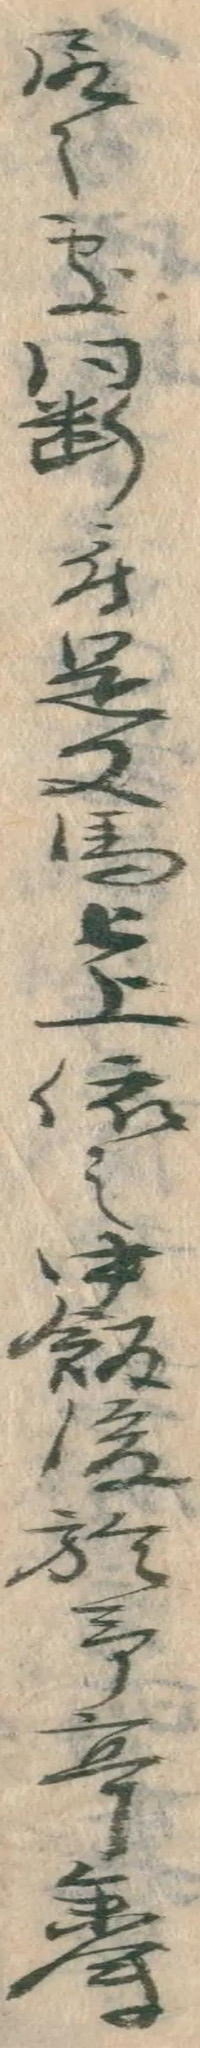尻之處同断ニ付是又馬上被上依之中飯後於予亭参會
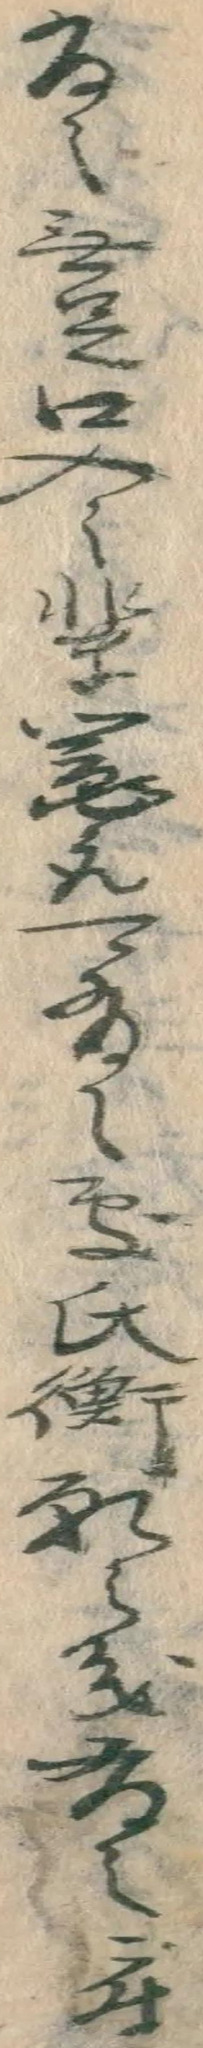有之無足口入之輩鬮取可有之處氏衡願之義有之ニ付
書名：賀茂社記録. 第63冊
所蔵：国立国会図書館 National Diet Library, JAPAN
